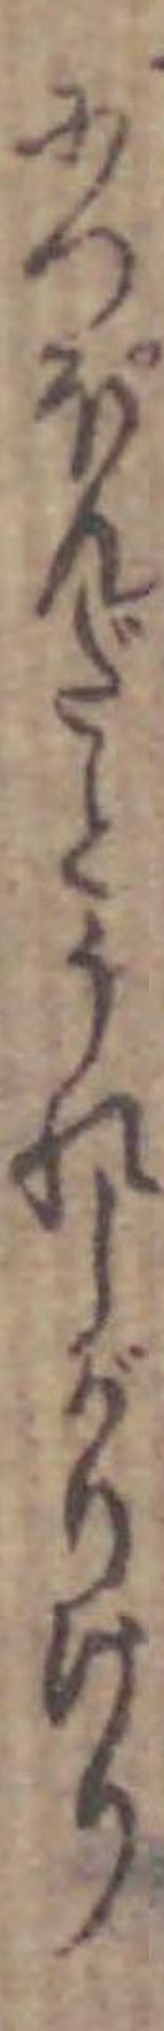につぽんだとうれしがりけり
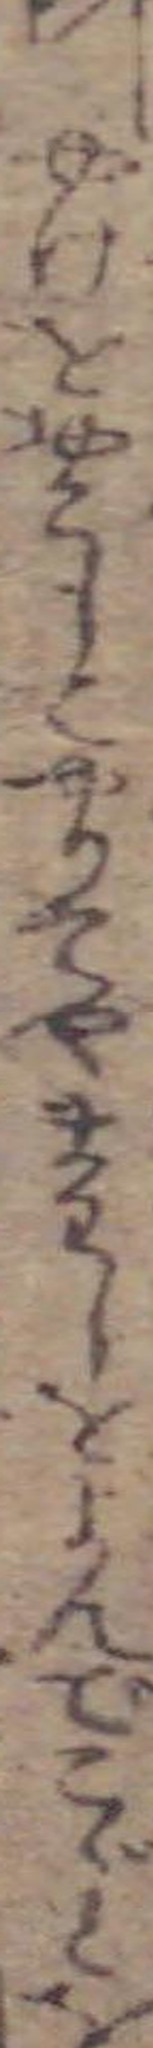やけをおこしてやりてやまわしをよんでこゞとを
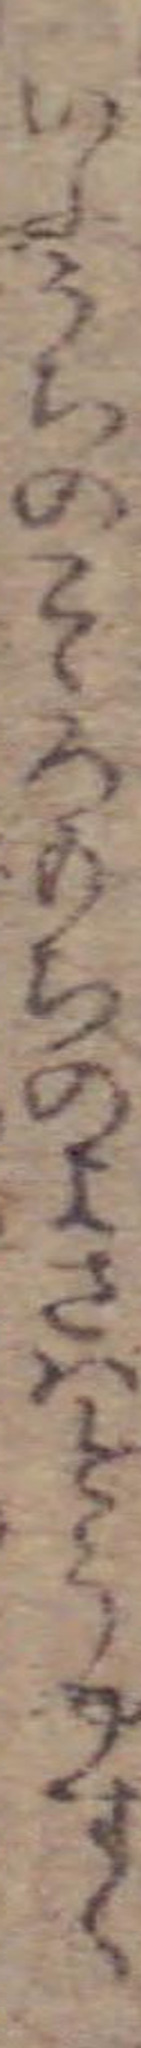いふうちのこゝろもちのよさはどうやすく
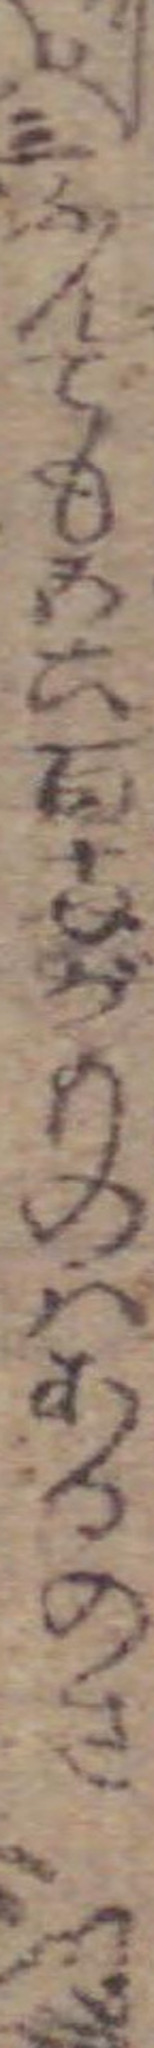ふんでも五六百両がものはあるのさ
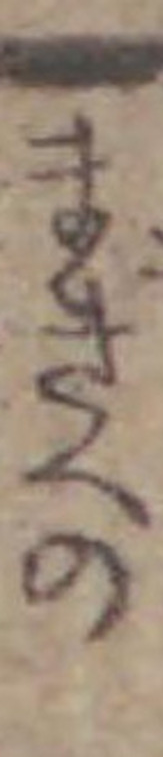まきへの

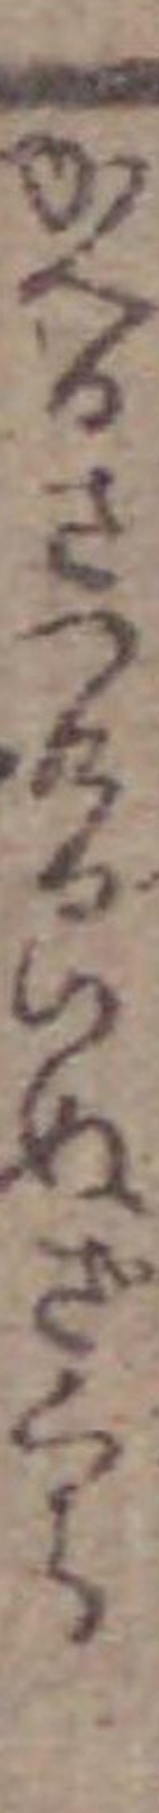かへるさつけるいぬざくら
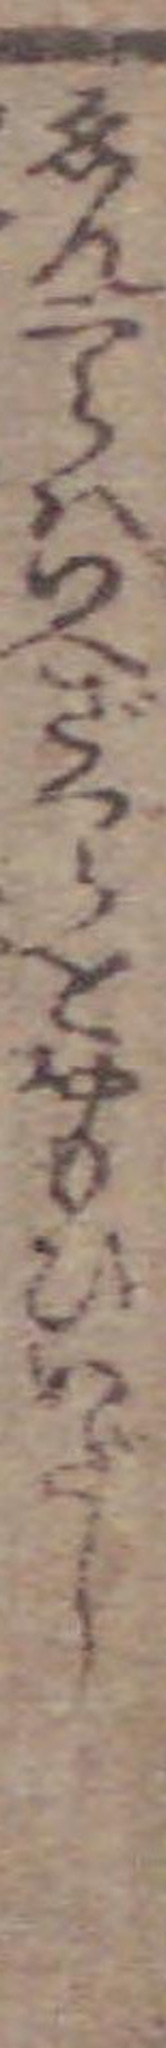ゑん二郎はいへざくらをおもひいだし
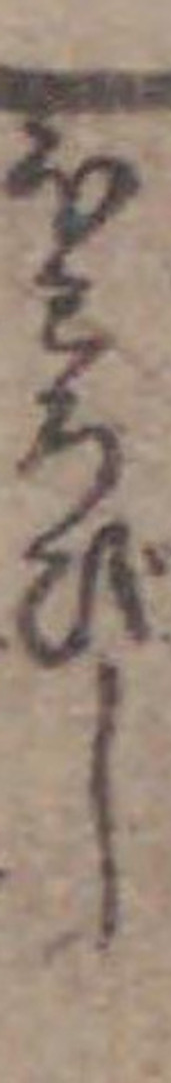ほころびし
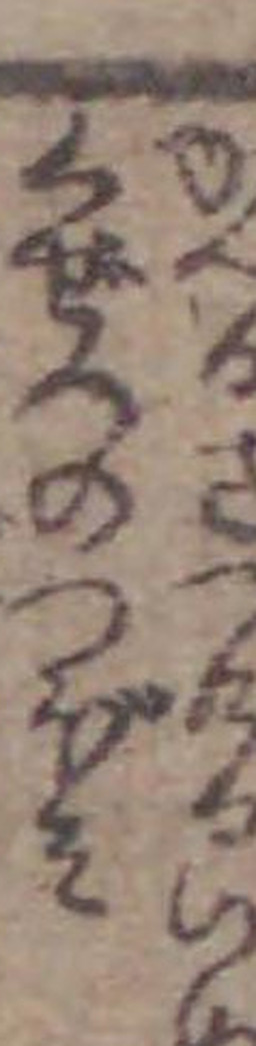くせつのつぼみ
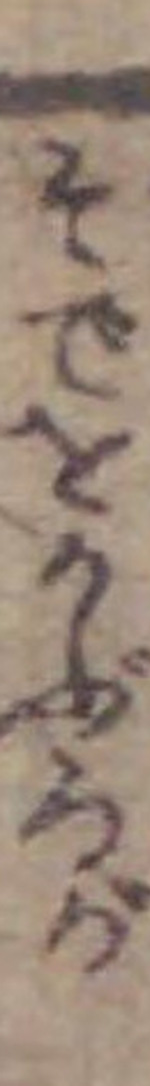そでをかぶろが
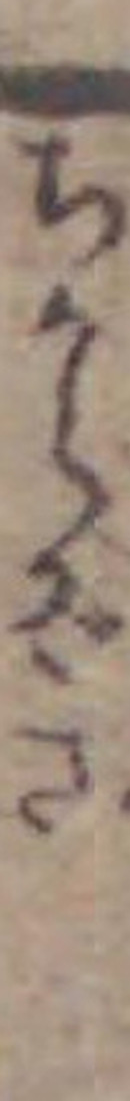ちからぐさ
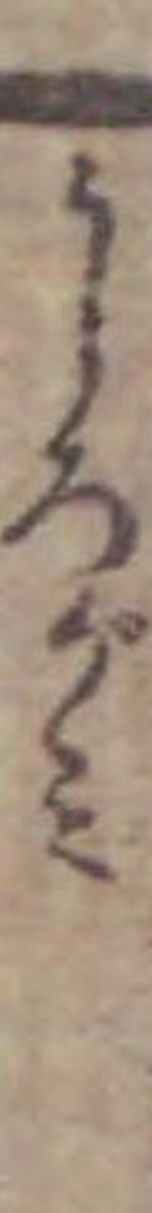うしろがみ
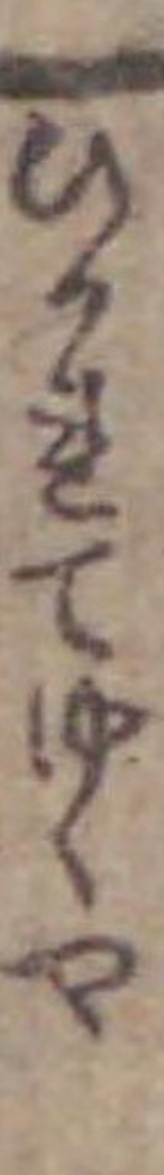ひかれてゆくや
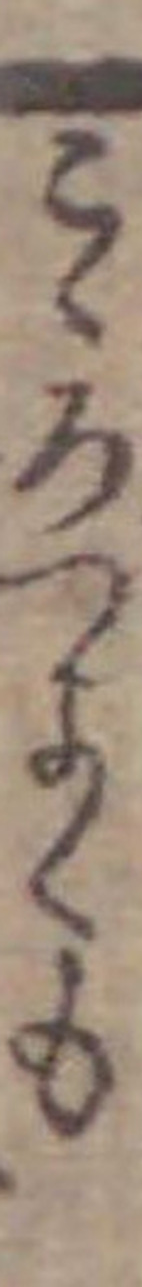こゝろつよくも
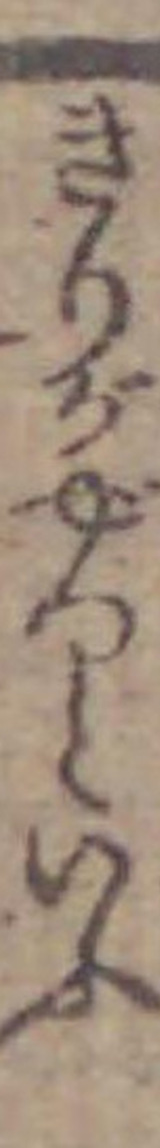きりがやつといふ
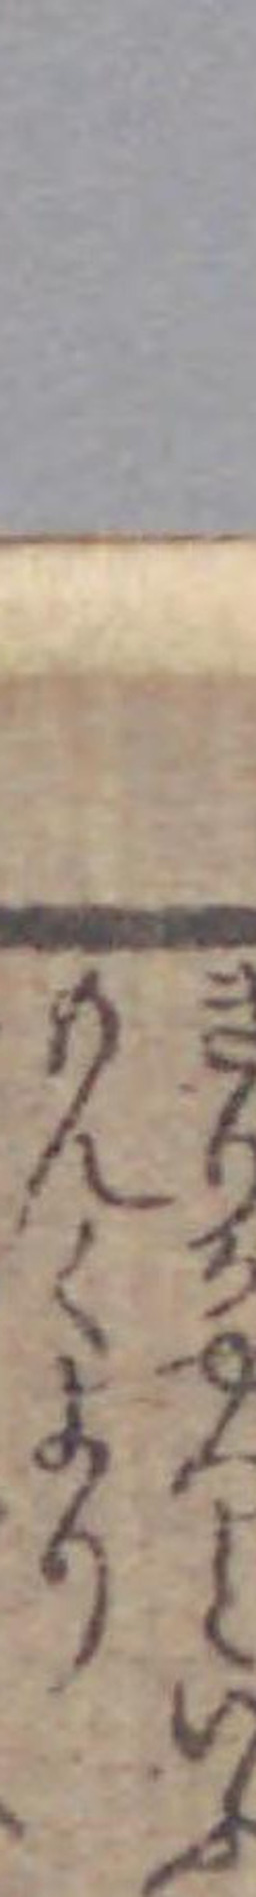もんくより
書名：江戸生艶気樺焼 : 3巻
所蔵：国立国会図書館 National Diet Library, JAPAN
